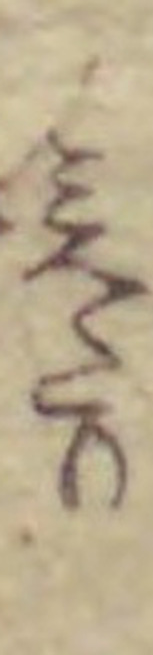みへたり
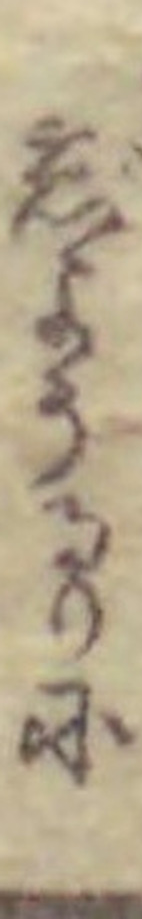じようるりに
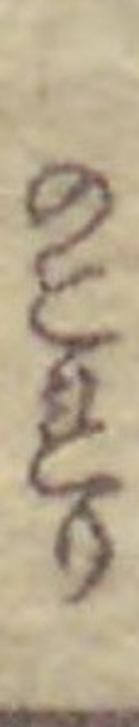のこれり
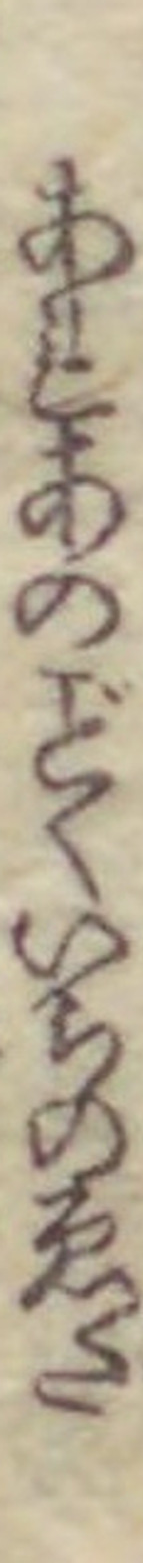あれあのことくいちのゑだ
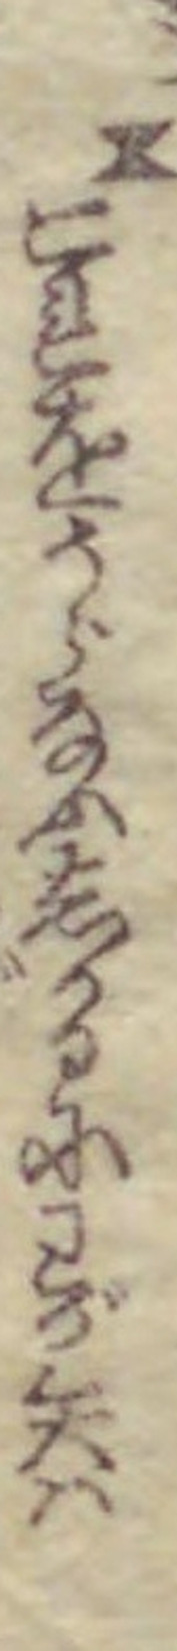▼▲これをうらなふしかるにわが矢は
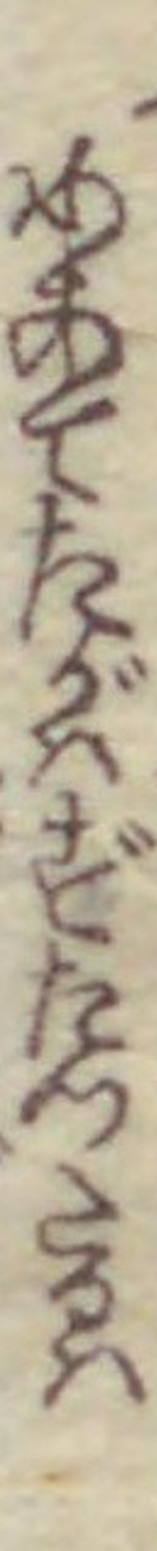めあてたがはずたつたるは
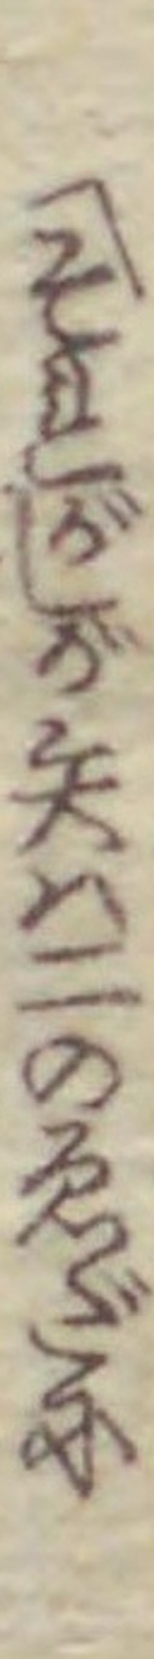〽それがしが矢は二のゑだに
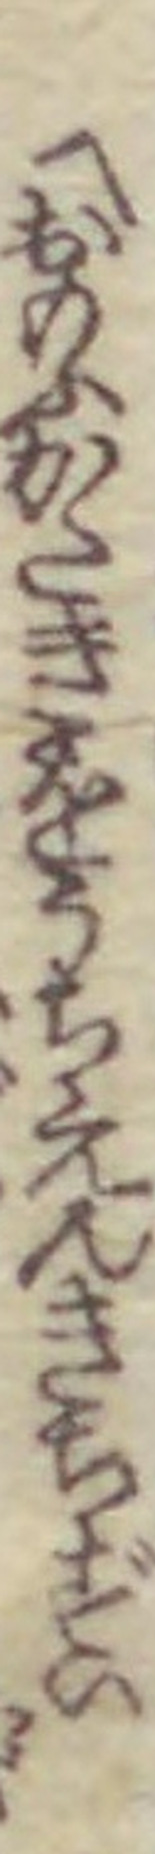〽おもふかたきをうちえんきちずい
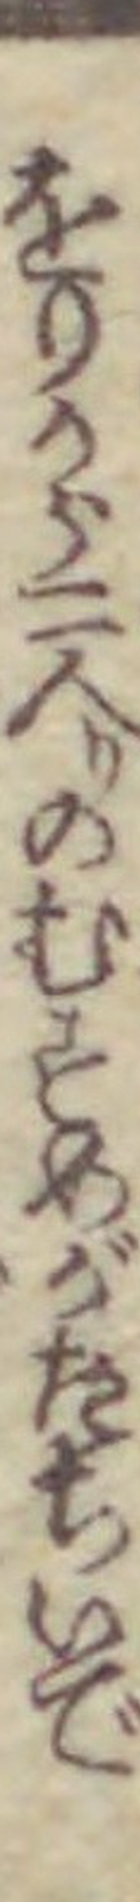をりから二人のむすめがたちいで
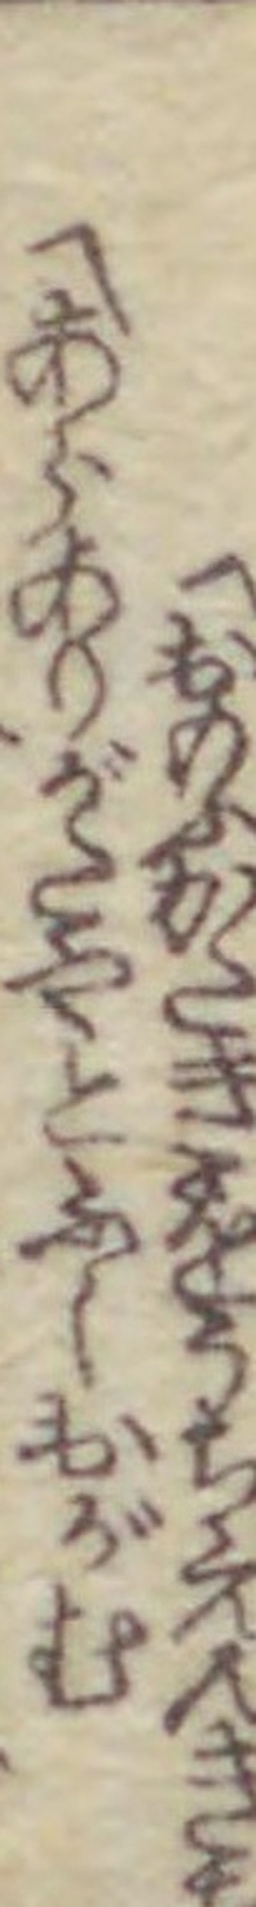〽あらありがたやとふしおがむ
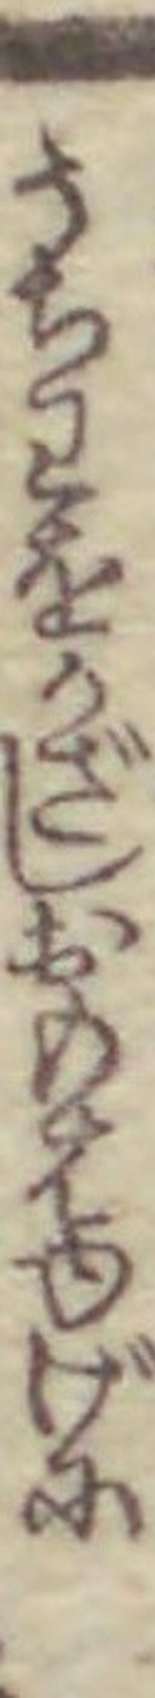うちわをかざしおもはゆげに
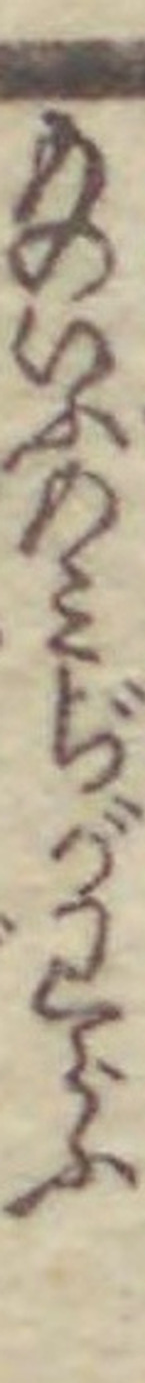ものいふもみぢがわらふ
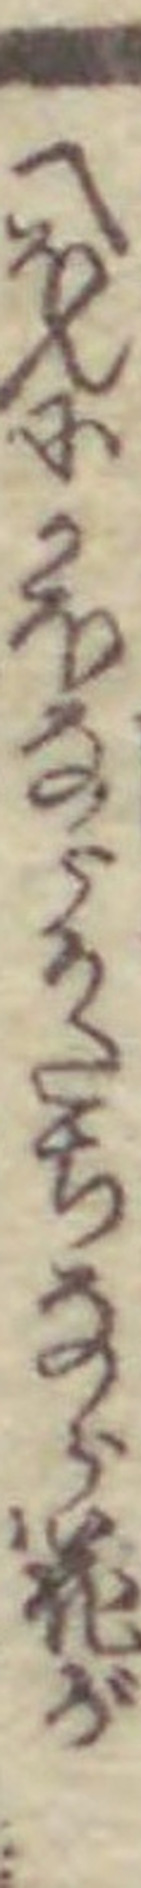〽ほんにかほならかたちなら花が
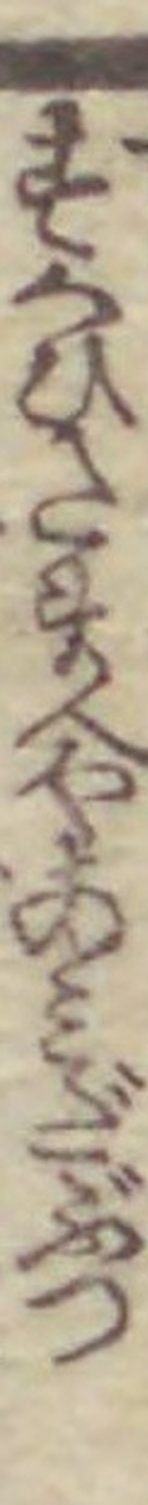すくひたまへやあみだぶつ
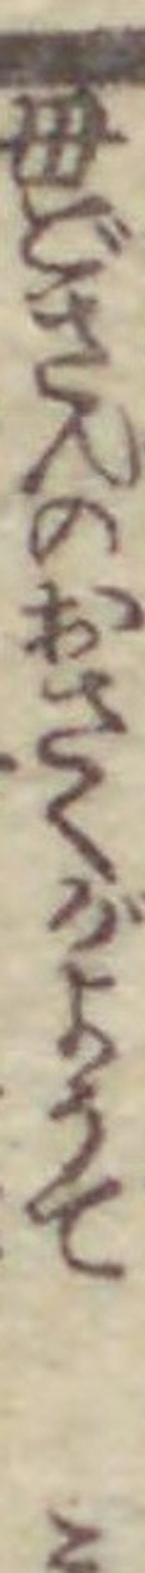母ごさんのおさくがようて
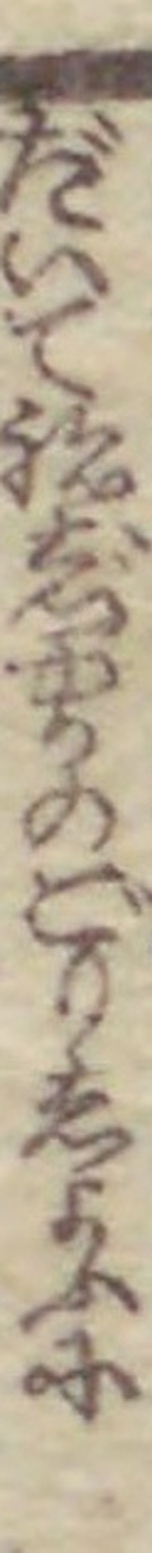だいてねじやかのごりしよふに
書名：大時代唐土化物 3巻. 曽我太夫染
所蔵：国立国会図書館 National Diet Library, JAPAN
